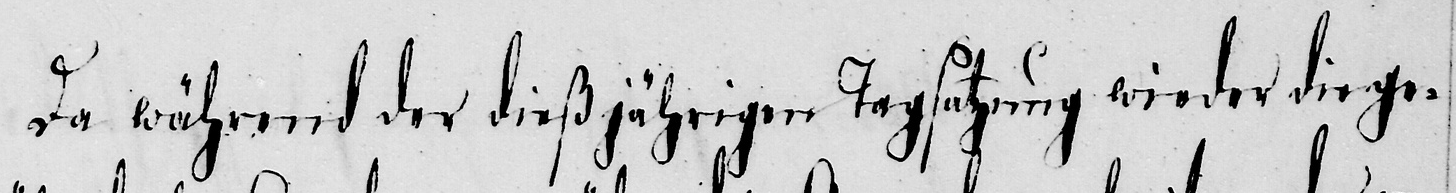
Da während der dießjährigen Tagsatzung wieder die ge¬
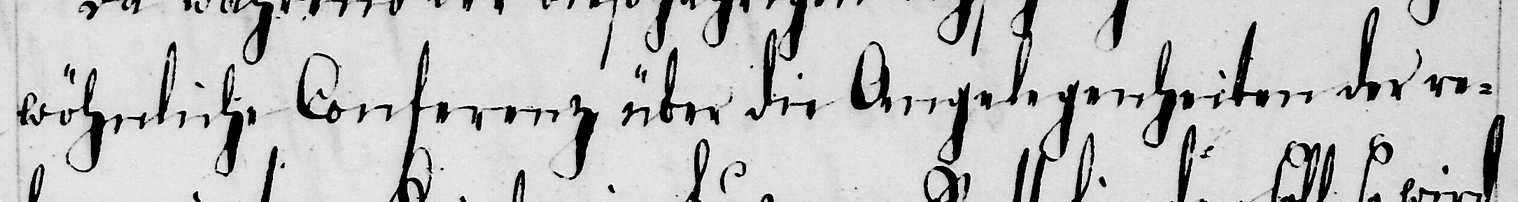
wöhnliche Conferenz über die Angelegenheiten der re¬
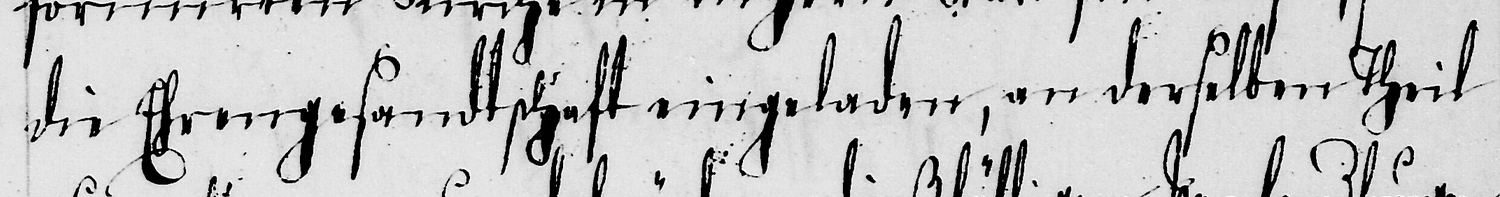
die Ehrengesandtschaft eingeladen, an derselben Theil
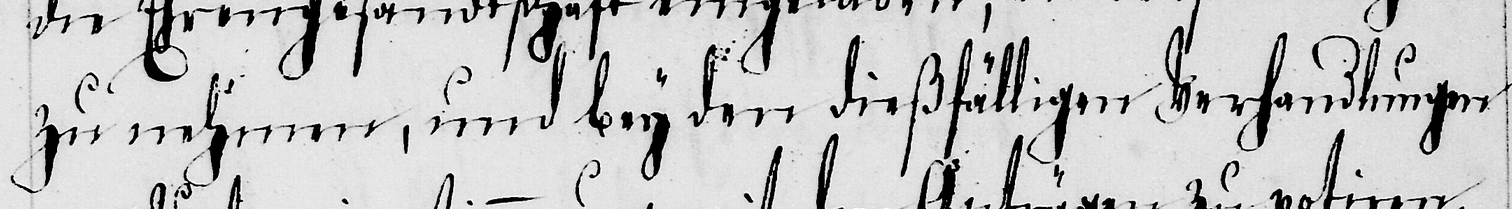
zu nehmen, und bey den dießfälligen Verhandlungen
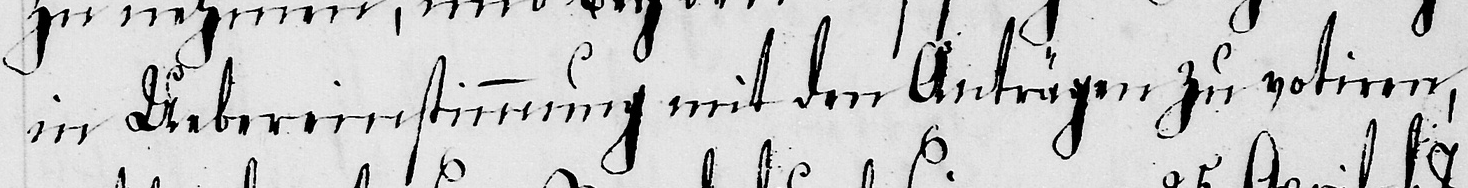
in Uebereinstimmung mit den Anträgen zu votiren,
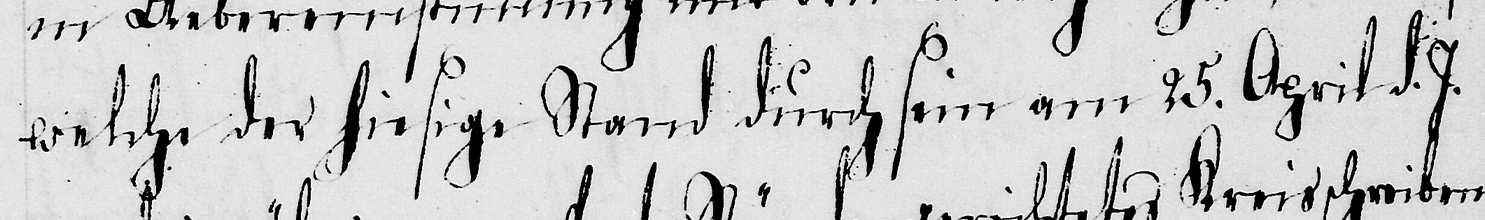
welche der hiesige Stand durch sein am 25. April d. J.
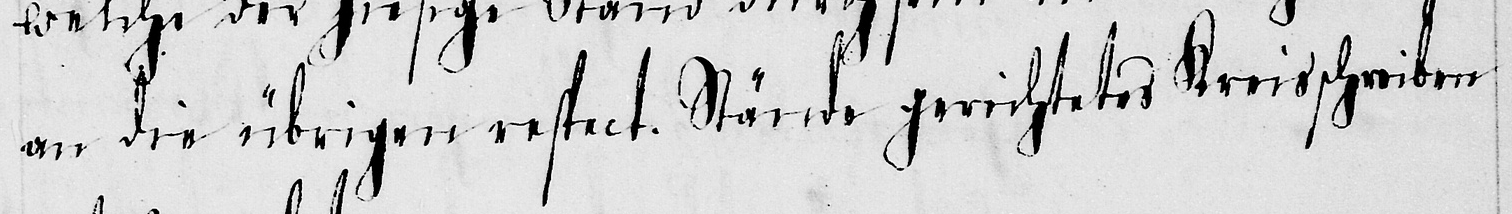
an die übrigen respect. Stände gerichtetes Kreisschreiben
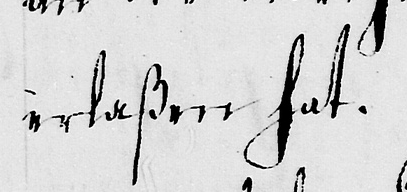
erlaßen hat.
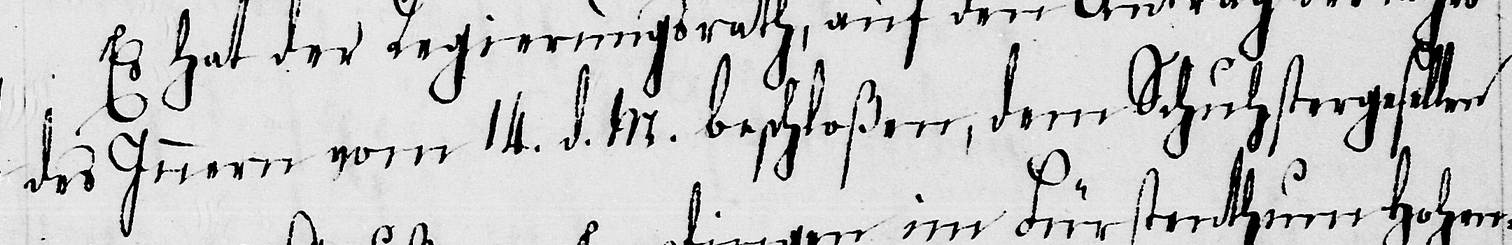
des Innern vom 14. d. M. beschloßen, dem Schuhstergesellen
